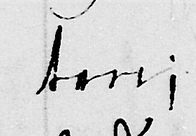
ten;
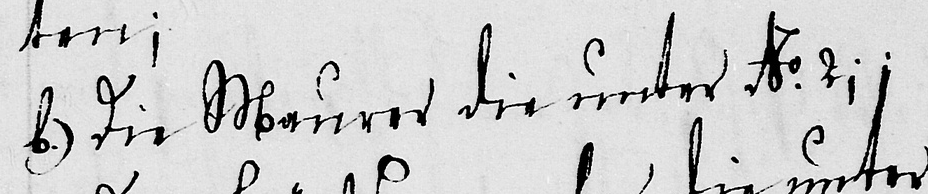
b.) Die Maurer die unter No. 2;
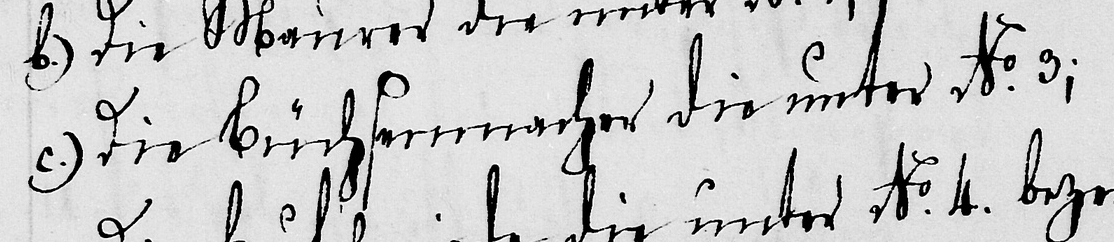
c.) Die Büchsenmacher die unter No. 3;
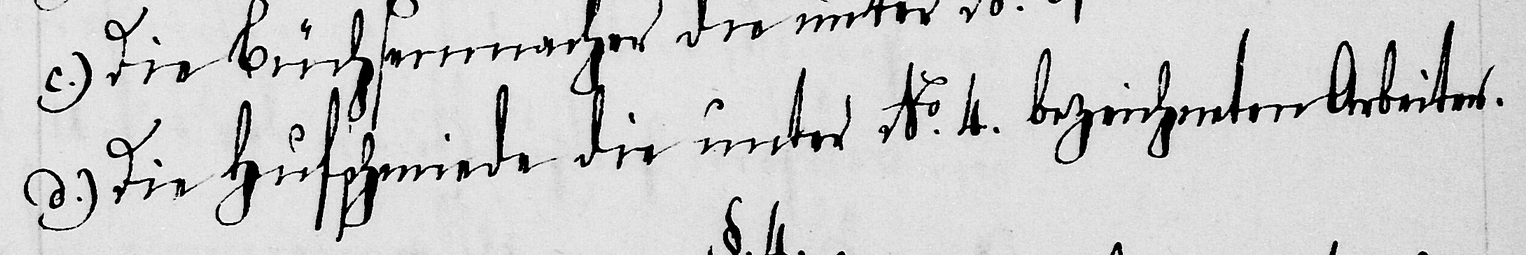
d.) Die Hufschmiede die unter No. 4. bezeichneten Arbeiten.
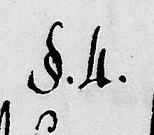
§. 4.
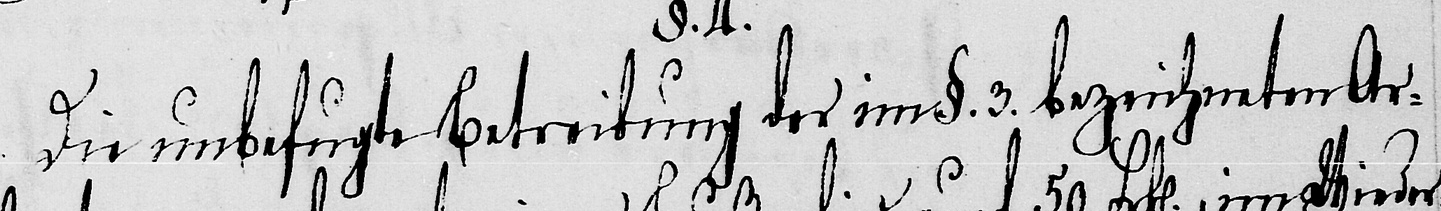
Die unbefugte Betreibung der im §. 3. bezeichneten Ar¬
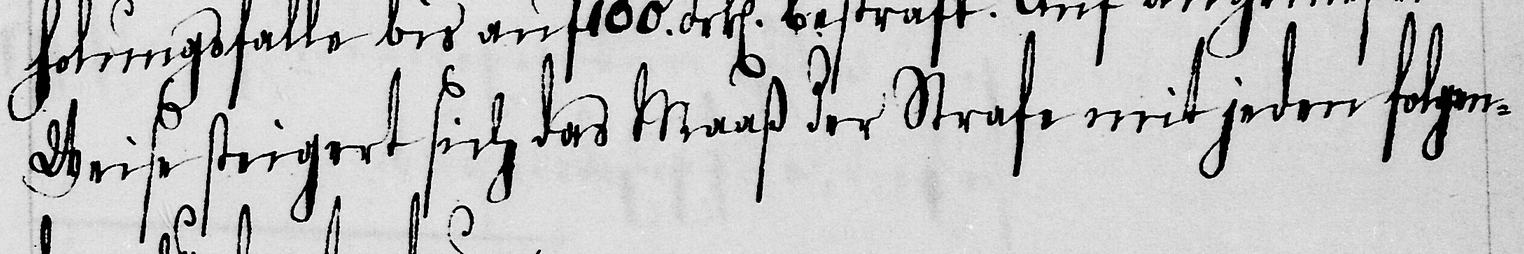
Weise steigert sich das Maaß der Strafe mit jeden folgen¬
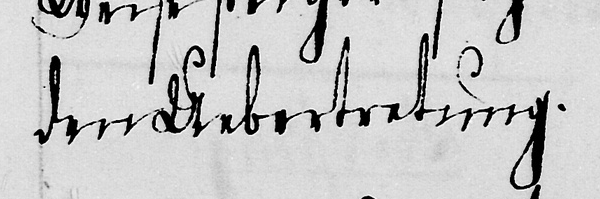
den Uebertretungen.
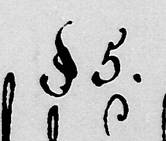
§. 5.
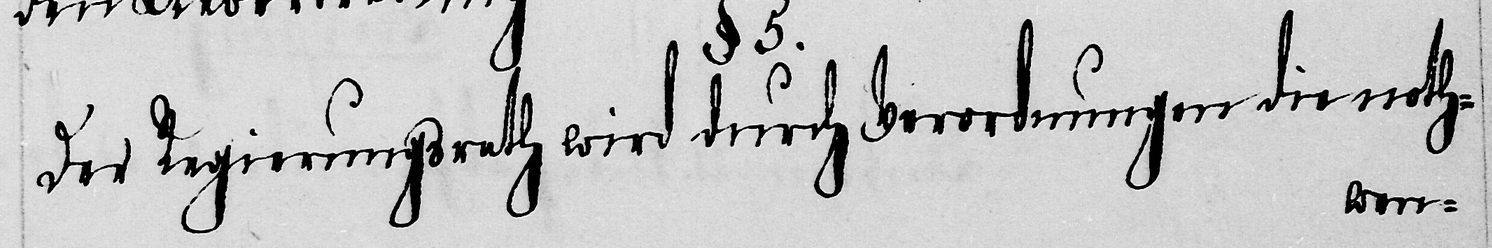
Der Regierungsrath wird durch Verordnungen die noth-
